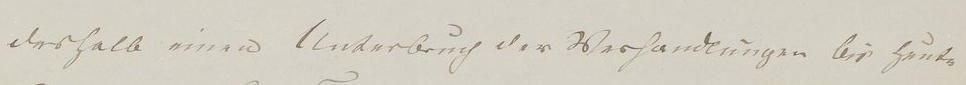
deshalb einen Unterbruch der Verhandlungen bis heute
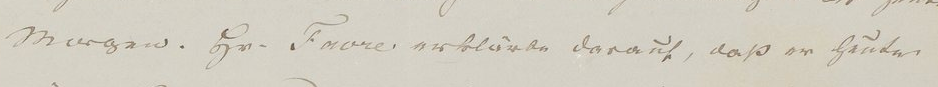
Morgen. Hr. Favre erklärte darauf, daß er heute
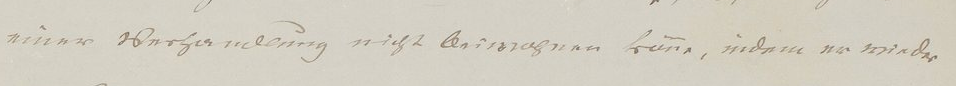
einer Verhandlung nicht beiwohnen könne, indem er wieder
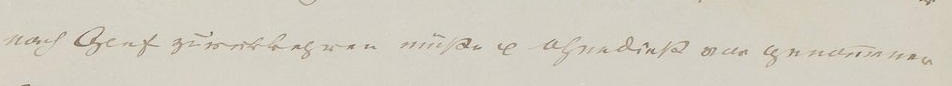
nach Genf zurückkehren müße u. ohnedieß vor genommener
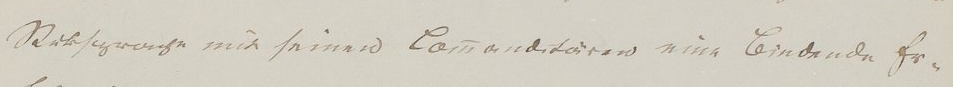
Rücksprache mit seinen Commanditären eine bindende Er-
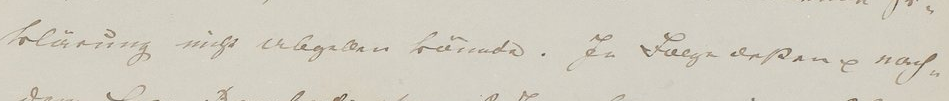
klärung nicht abgeben könnte. In Folge deßen u. nach-
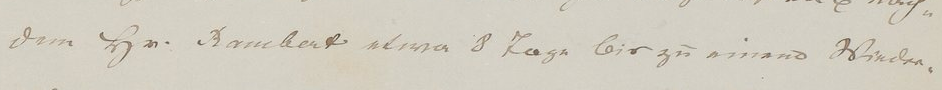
dem Hr. Rambert etwa 8 Tage bis zu einem Wieder-
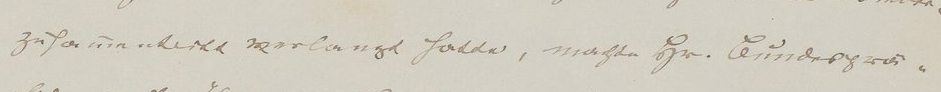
zusammentritt verlangt hatte, machte Hr. Bundesprä-
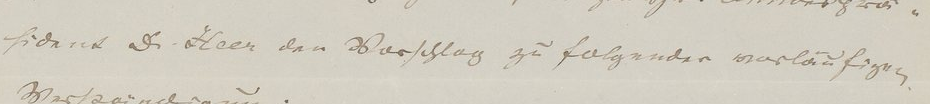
sident Dr. Heer den Vorschlag zu folgender vorläufiger
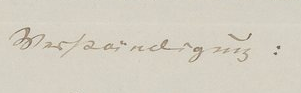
Verständigung:
